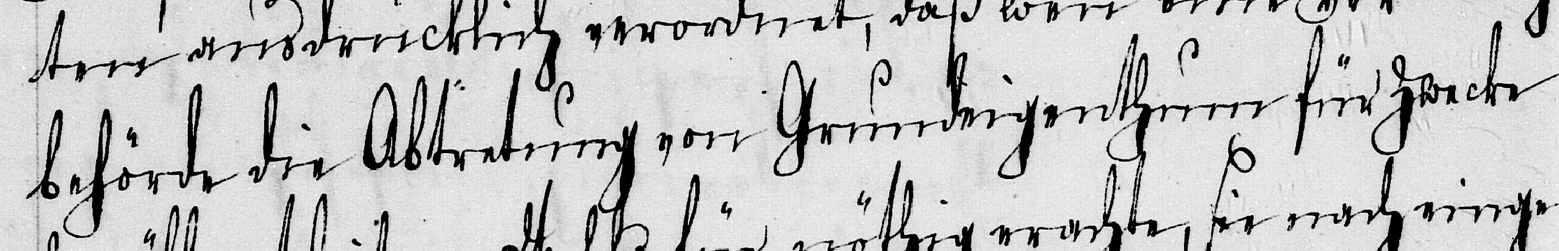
sbehörde die Abtretung von Grundeigenthum für Zwecke
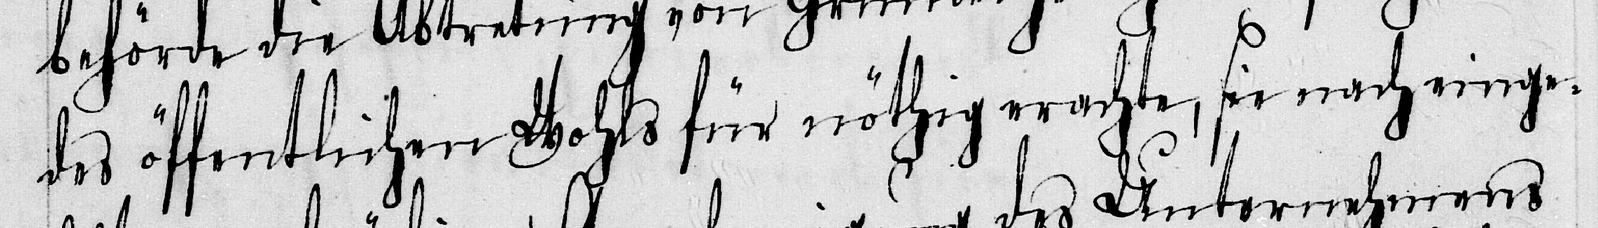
des öffentlichen Wohls für nöthig erachte, sie nach eing¬
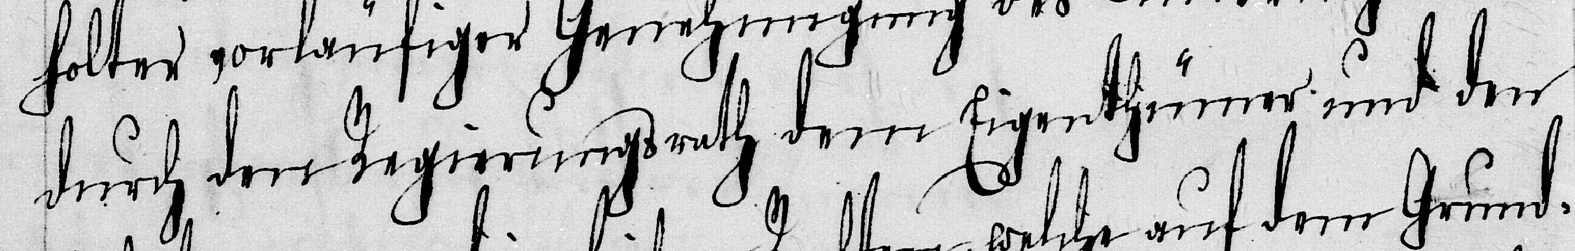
durch den Regierungsrath dem Eigenthümer und den
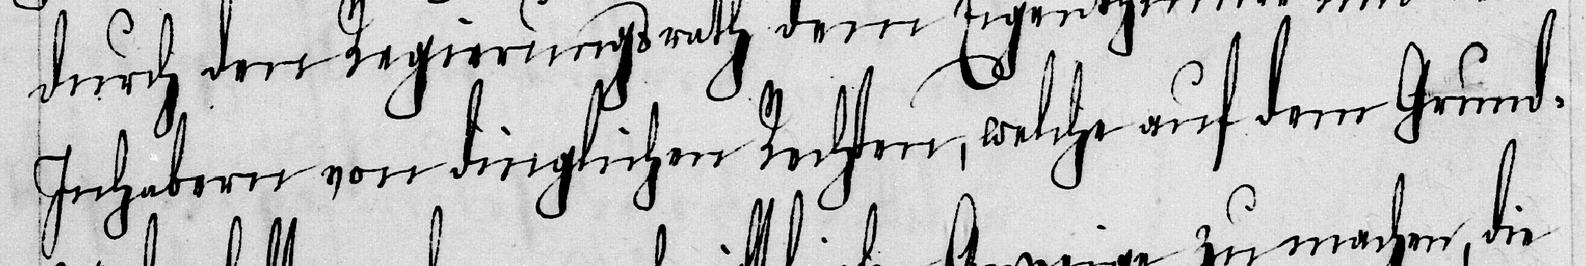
Inhabern von dinglichen Rechten, welche auf dem Grund¬
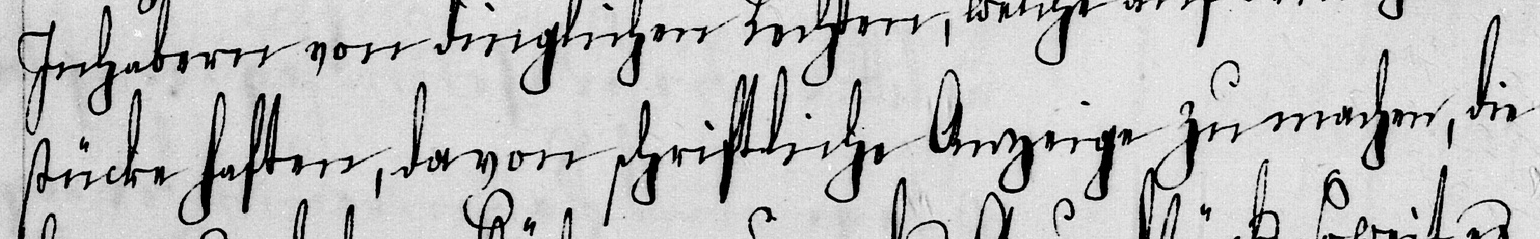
stücke haften, davon schriftliche Anzeige zu machen, die
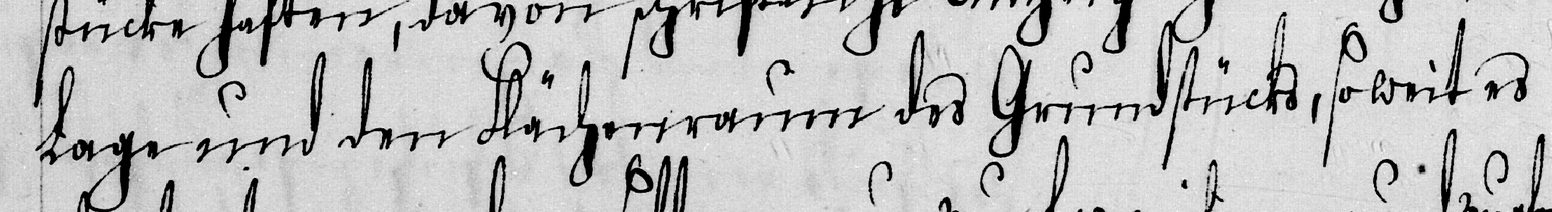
Lage und den Flächenraum des Grundstücks, soweit
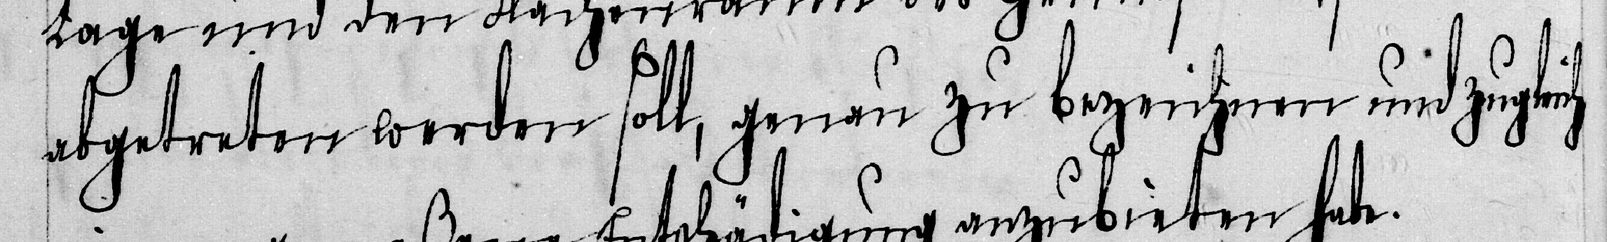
abgetreten werden soll, genau zu bezeichnen und zugle¬
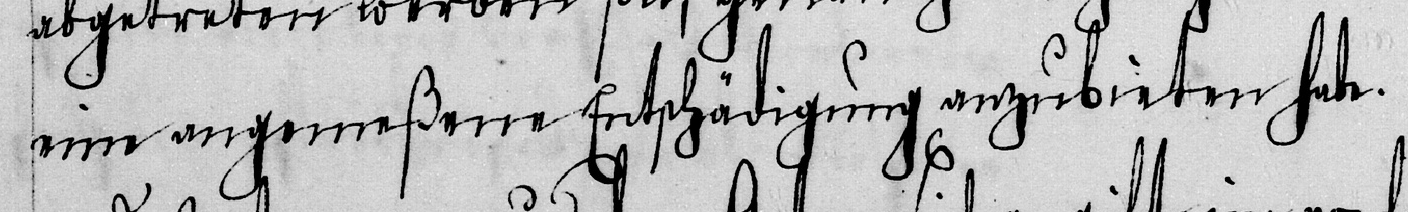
eine angemeßene Entschädigung anzubieten habe.
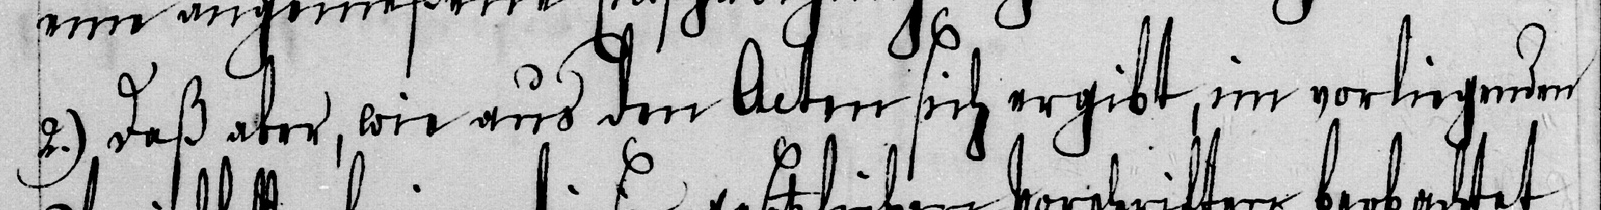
2.) Daß aber, wie aus den Acten sich ergibt, im vorliegenden
